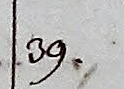39.
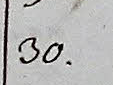30.
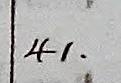41.
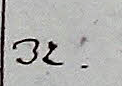32.
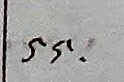55.
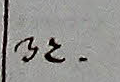32.
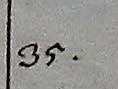35.
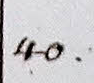40
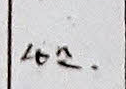42.
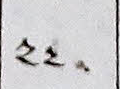22.
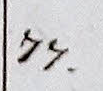77.
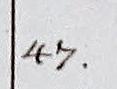47.
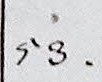53
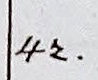42
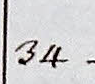34
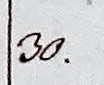30.
